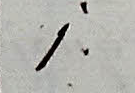1.
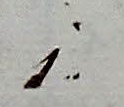1.
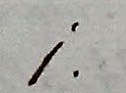1.
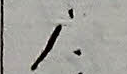1.
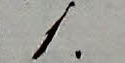1.
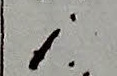1.
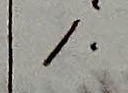1.
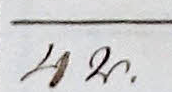42.
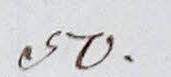50.
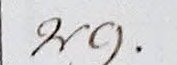29.
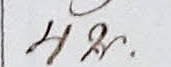42.
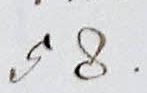58
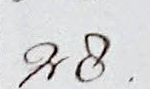28
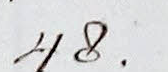48.
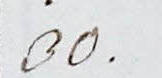30.
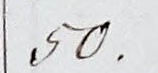50.
